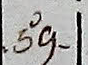59
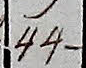44
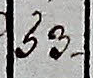53
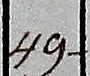49
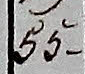55
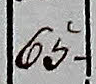65
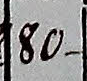80
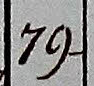79
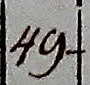49
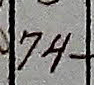74
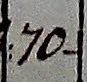70
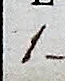1
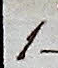1
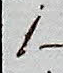1
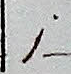1
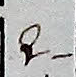2
